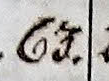63.
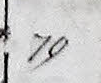79
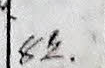82.
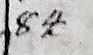84
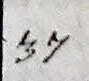37
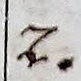2
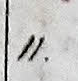11.
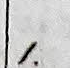1.
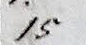15
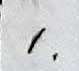1
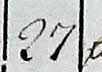27
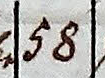58
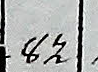82
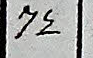72
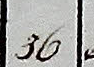36
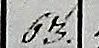63.
